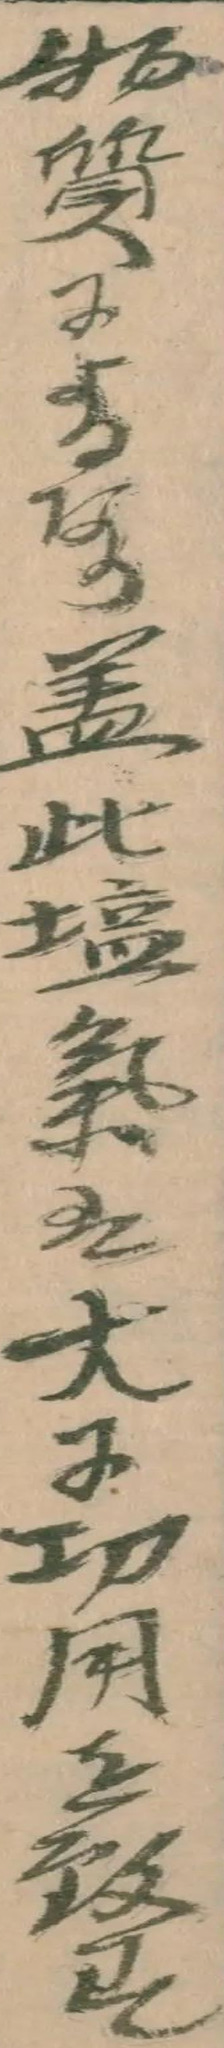物質によるなり蓋此塩気は大に功用を致す
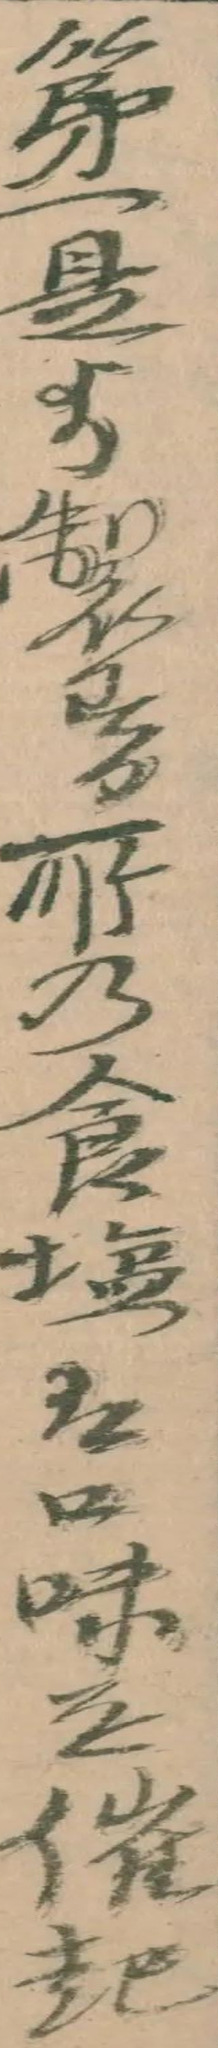第一是より製する所の食塩は口味を催起
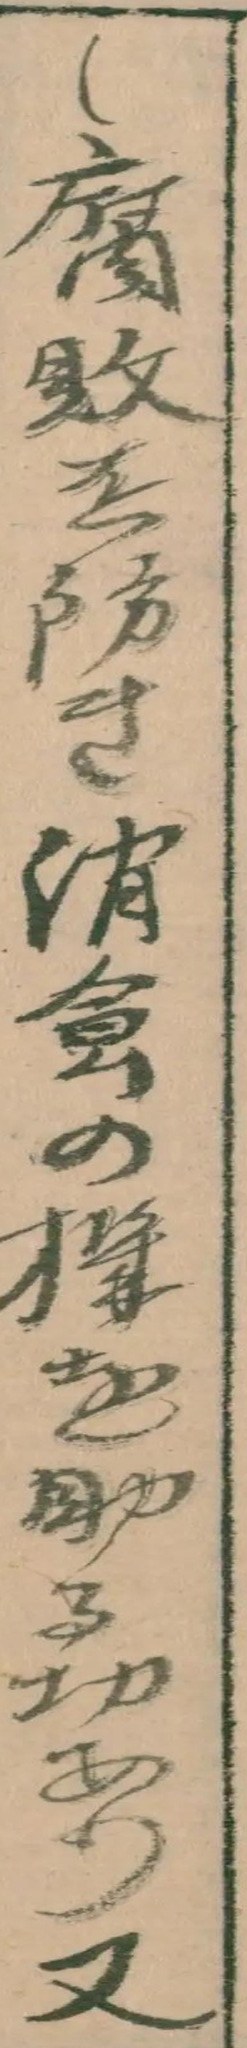し腐敗を防き消食の様を助る功あり又
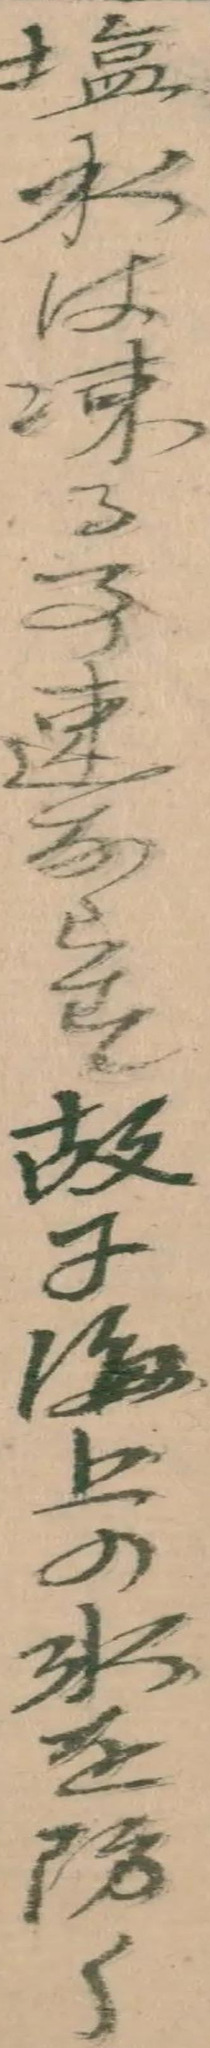塩水は凍る事速ならす故に海上の氷を防く
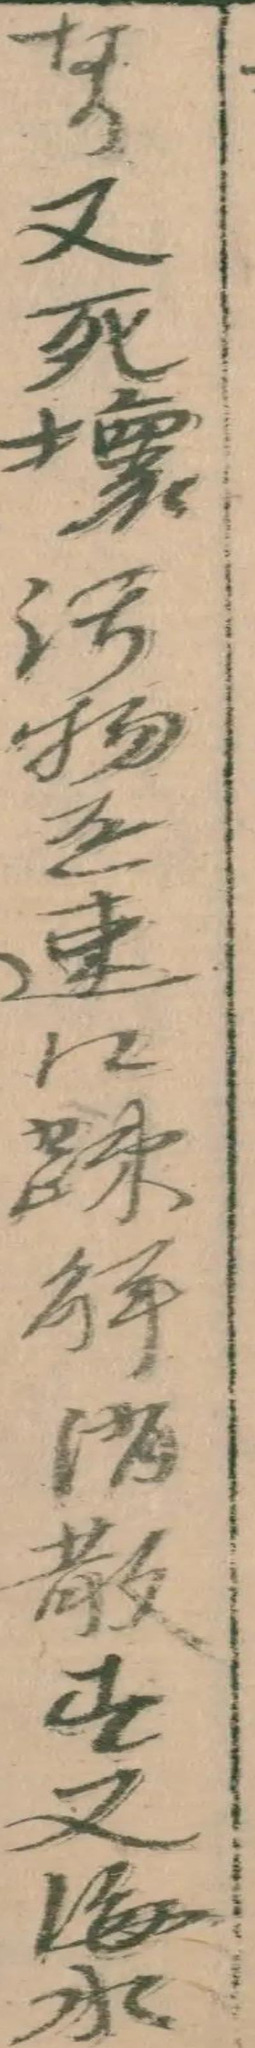なり又死壊汚物を速に疎解消散す又海水
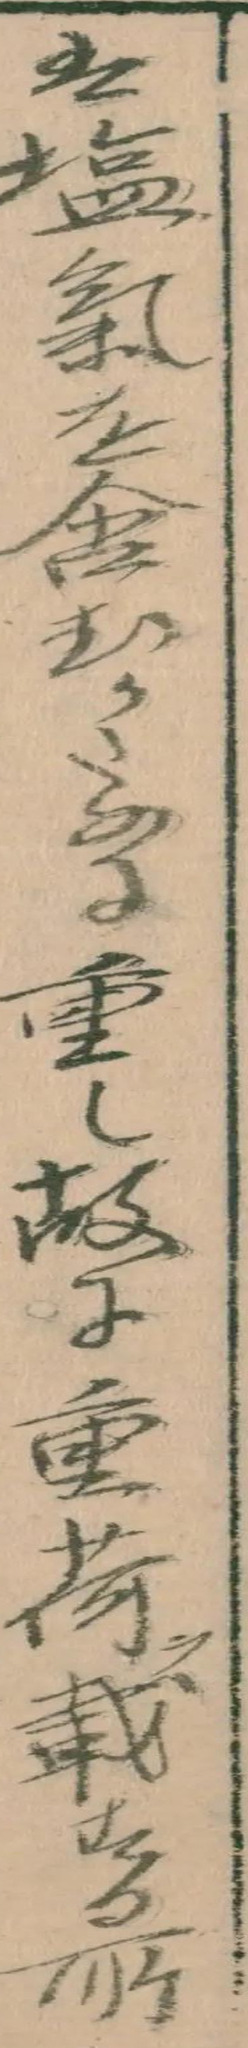は塩気を含むかために重し故に重荷ヲ載する所
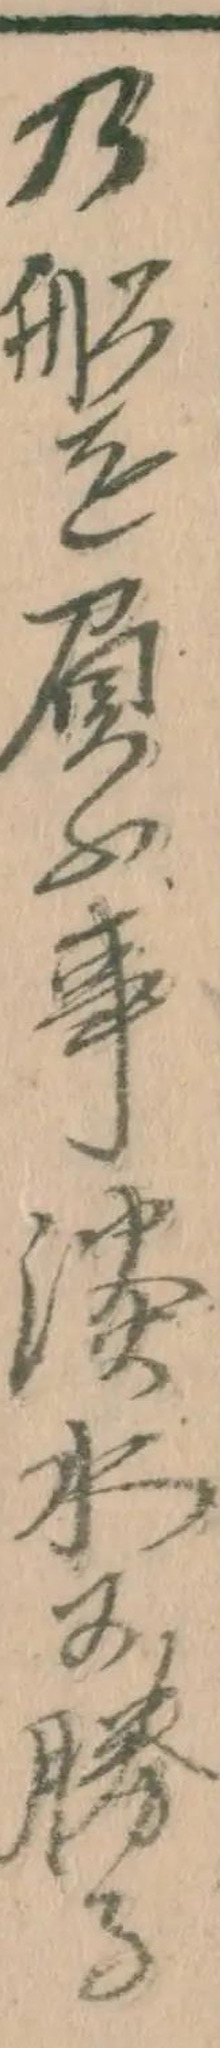の船を負ふ事淡水に勝る
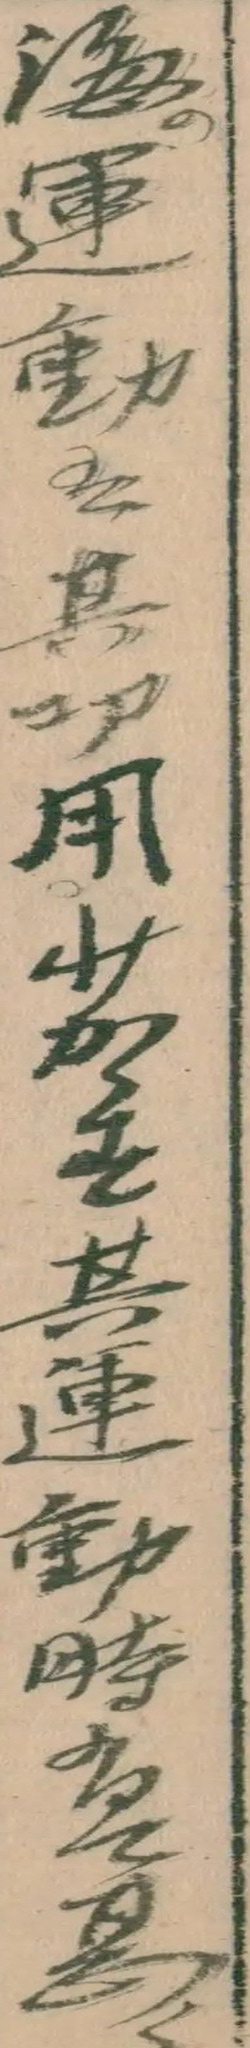海の運動は其功用少からす其運動時有て甚く
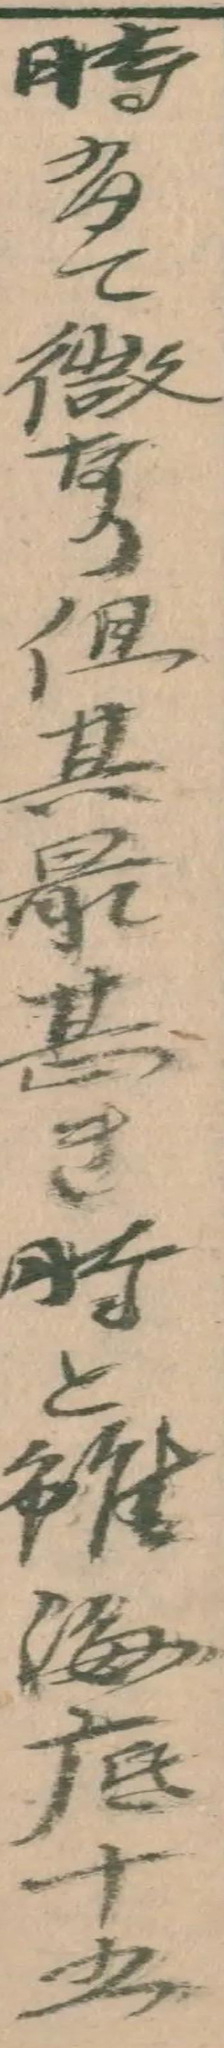時有て微なり但其最甚き時と雖海底十五
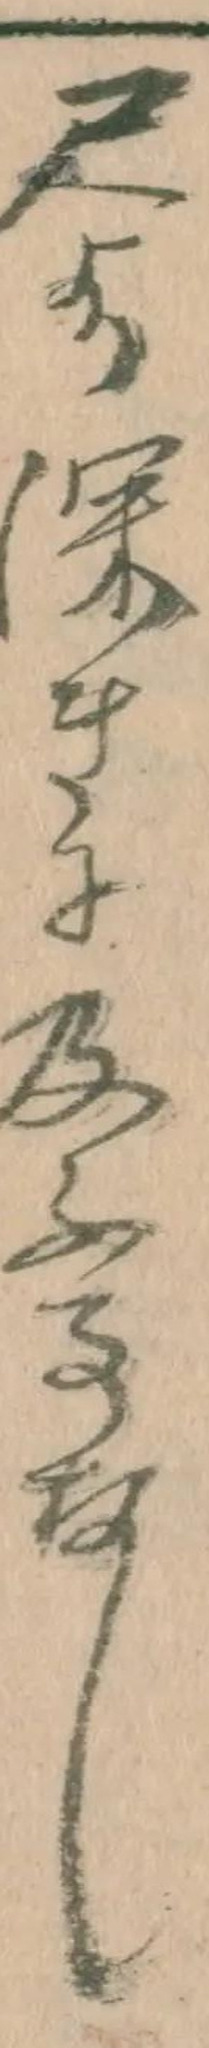尺より深きに及ふ事なし
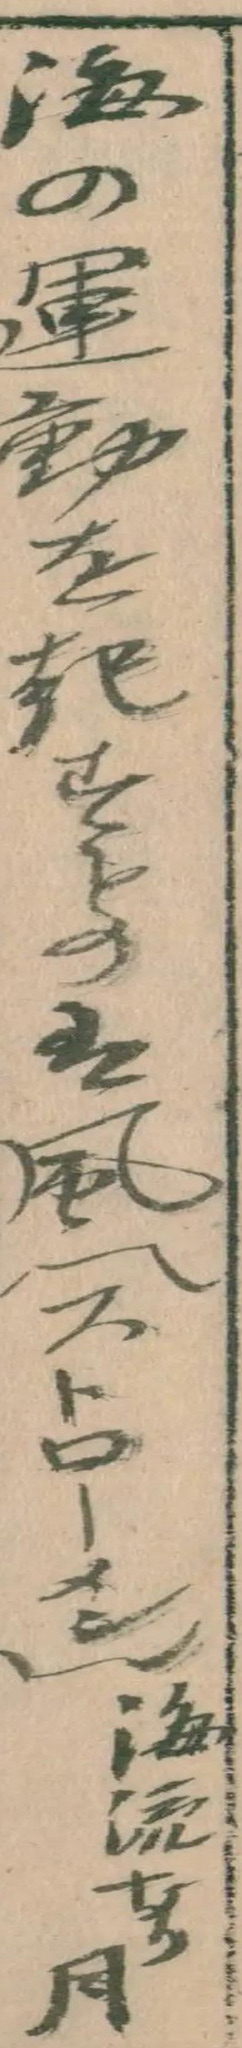海の運動を起すものは風(ストローメン)海流なり月
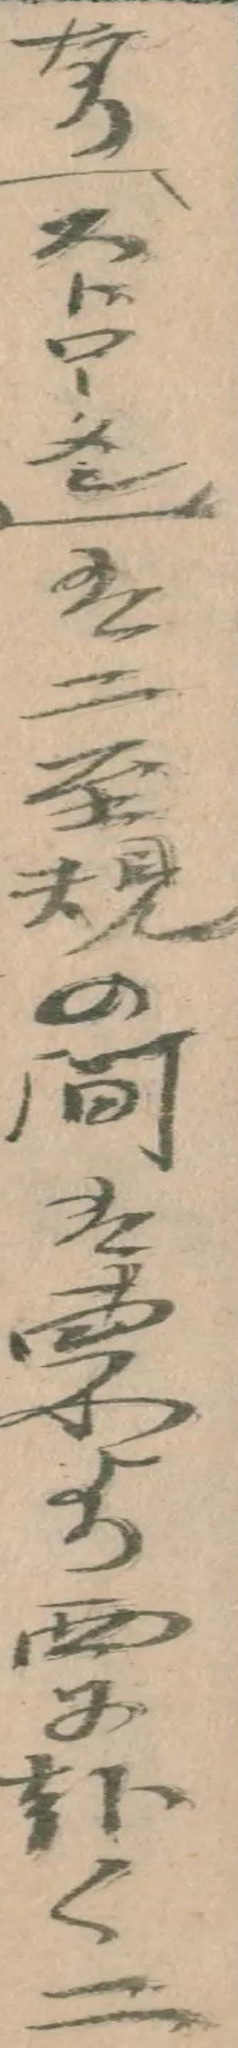なり(ストローメン)は二至規の間は東より西に赴く二
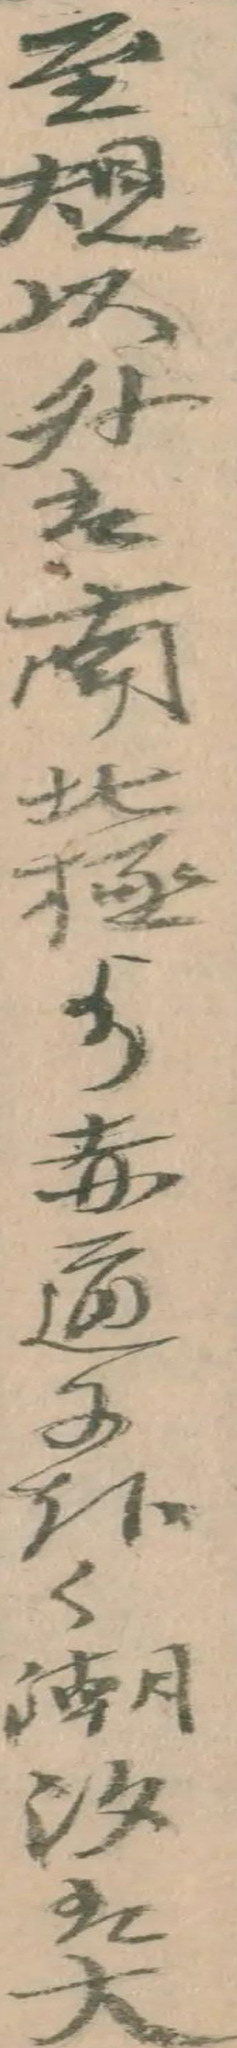至規以外は南北極より赤道に赴く潮汐は大

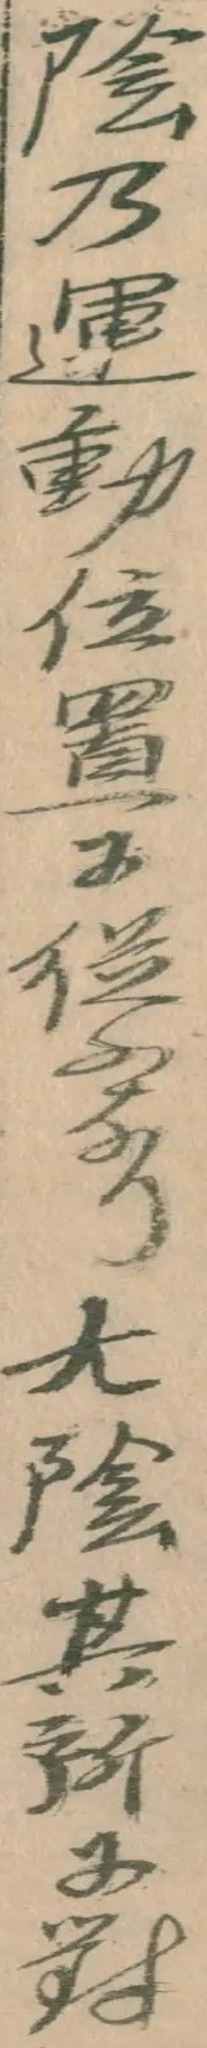陰の運動位置に従ふなり大陰其所に対
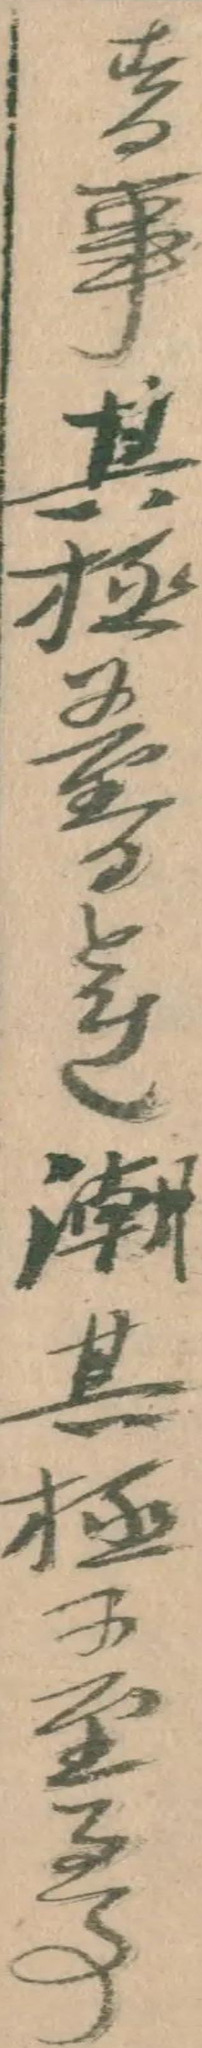する事其極に至るとき潮其極に至る事
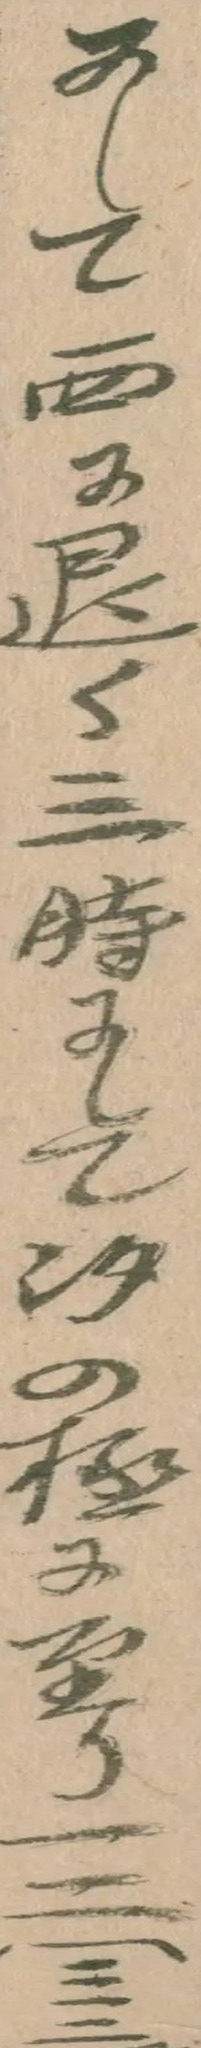にして西に退く三時にして汐の極に至り一二(ミニュ
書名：新釈輿地図説
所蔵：国立国会図書館 National Diet Library, JAPAN
